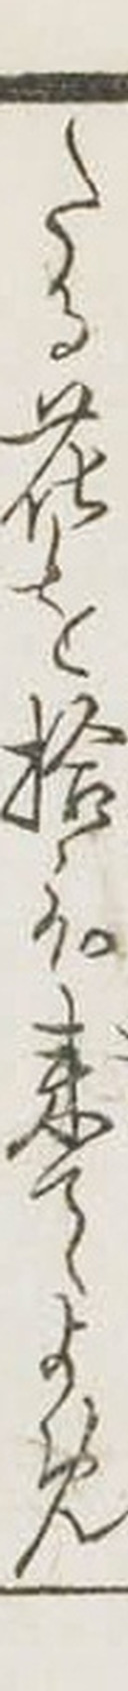たる花を拾ひ来てよめ
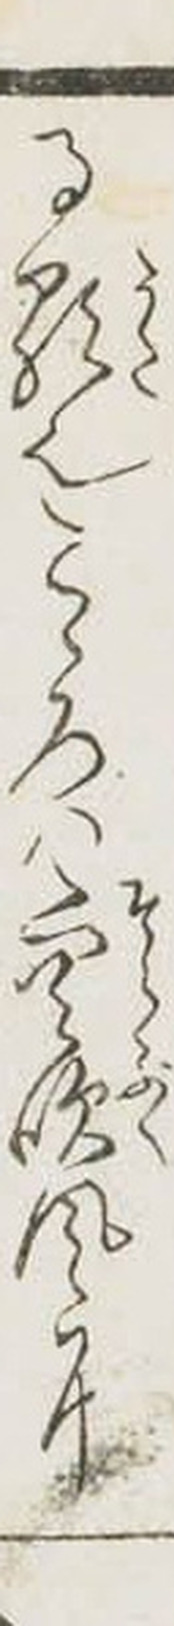る歌也こゝろは空吹風に
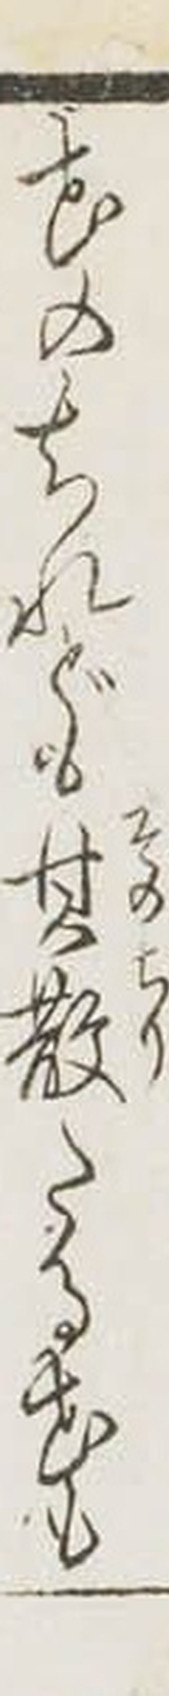花のちれども其散たる花も
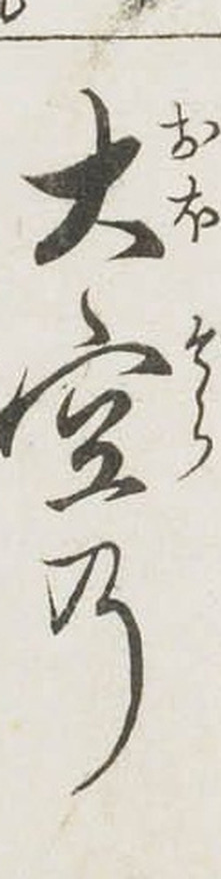大空の
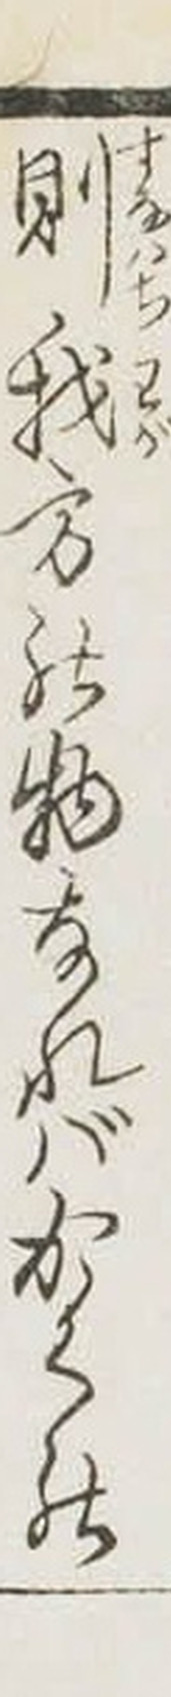則我方の物なればかくの
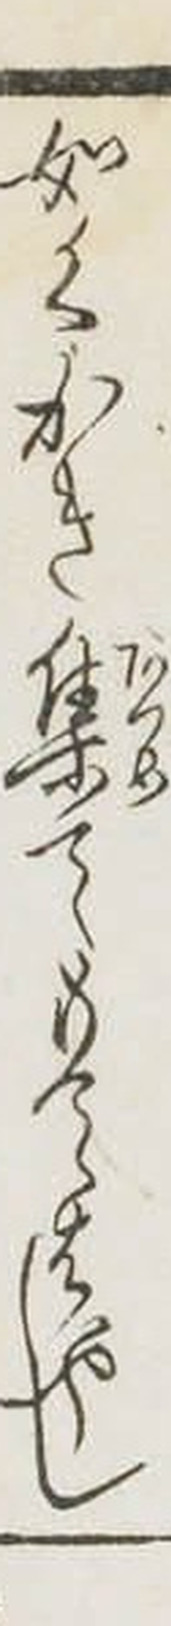如くかき集てもてはやし
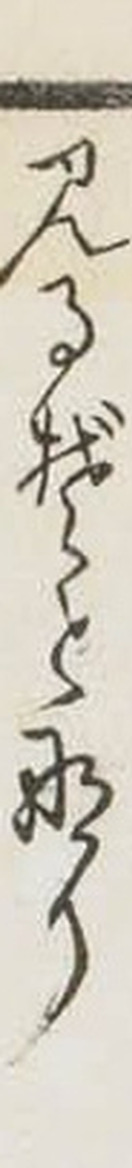見るぞとなり
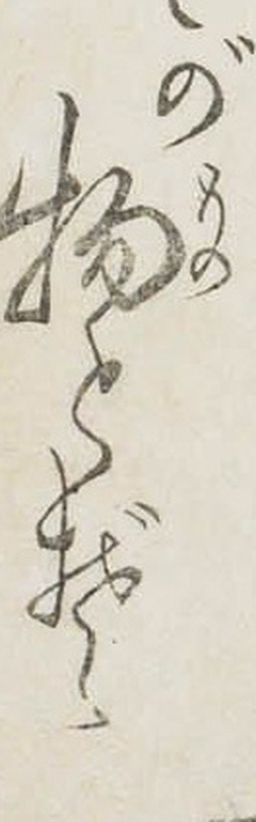物とぞ
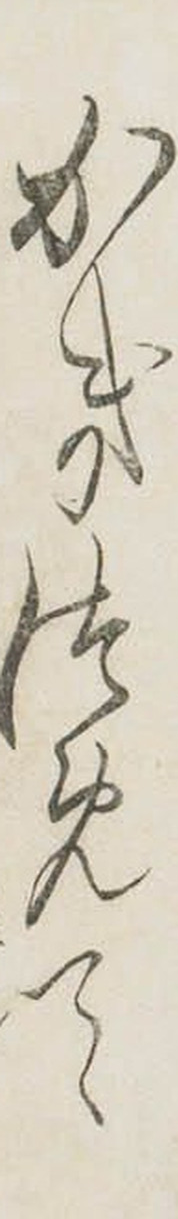かきつめて

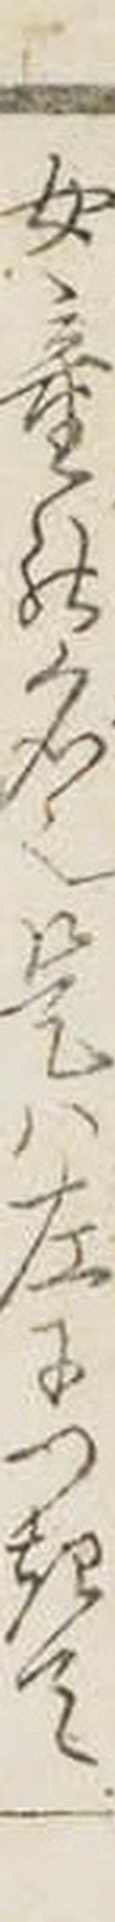女童の名也是は左につきて
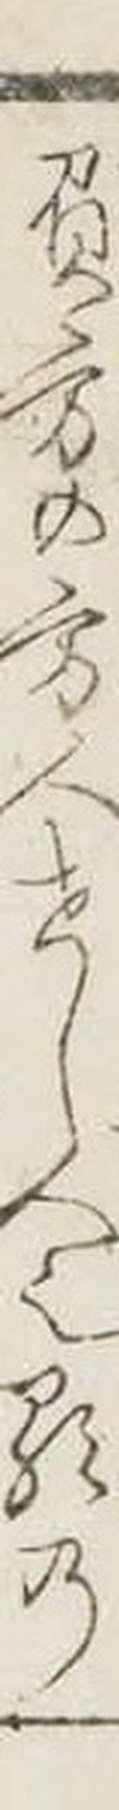負方の方人せし人也歌の
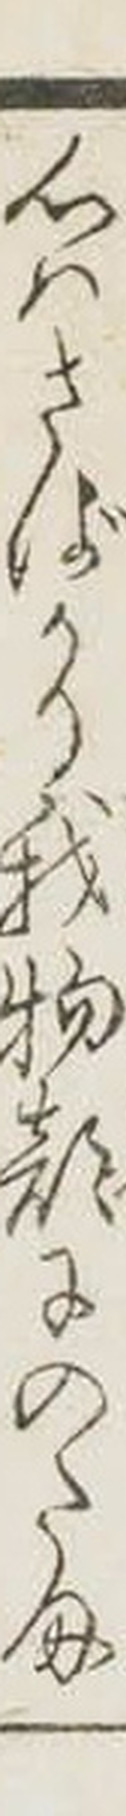心はさばかり我物顔にもたま
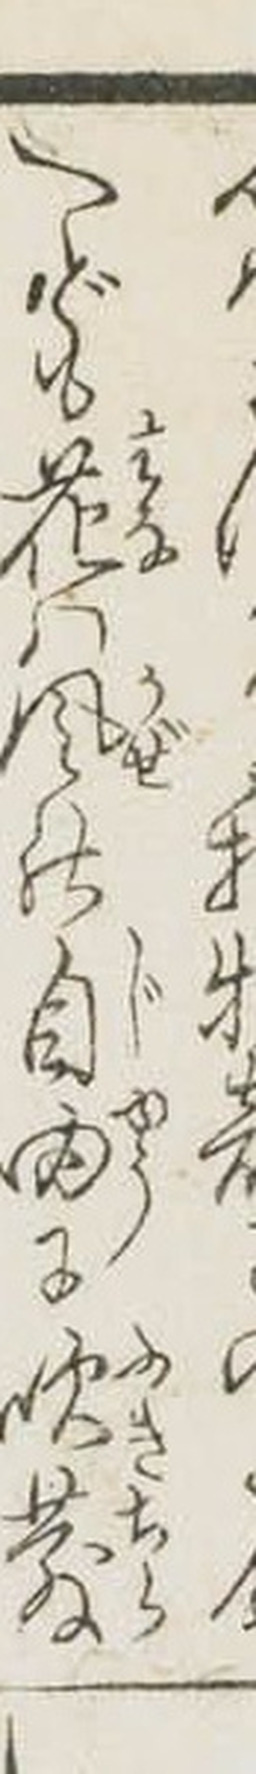へども花は風の自由に吹散
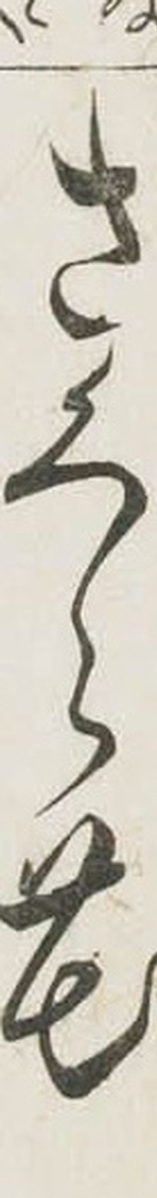さくら花
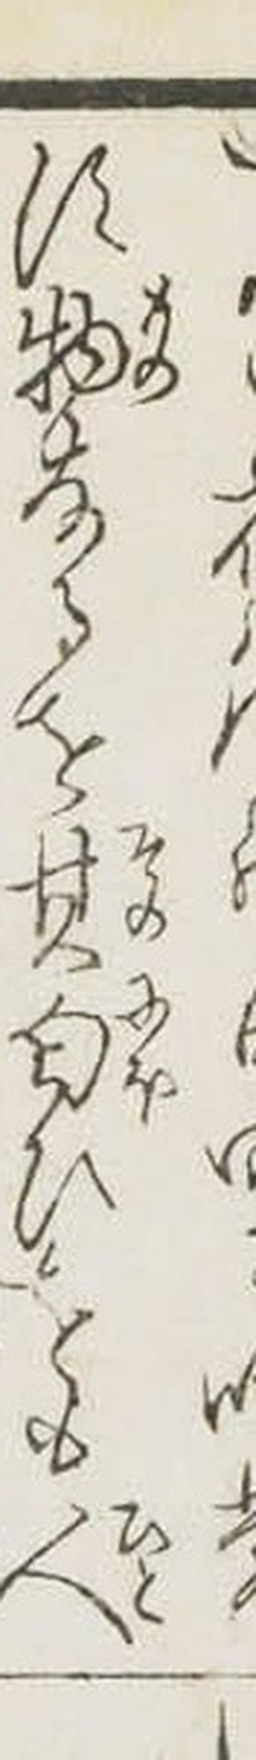す物なるを其匂ひをも人
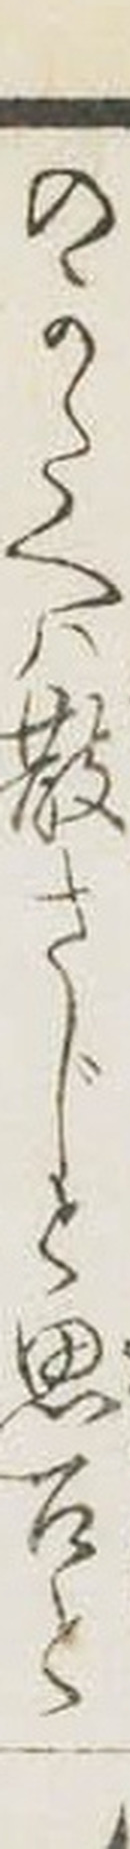のかたへは散さじと思召と
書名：源氏百人一首
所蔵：東京学芸大学教育コンテンツアーカイブ
